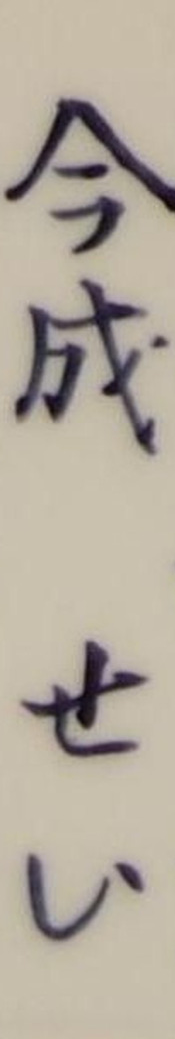今成せい
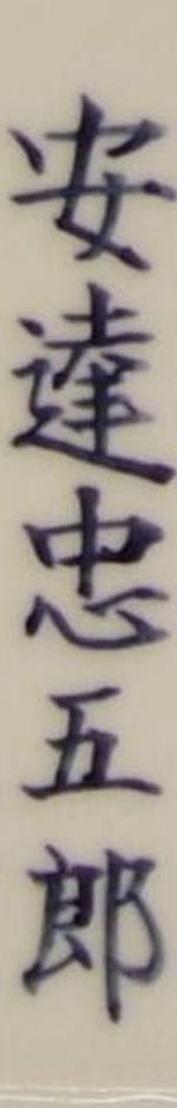安達忠五郎

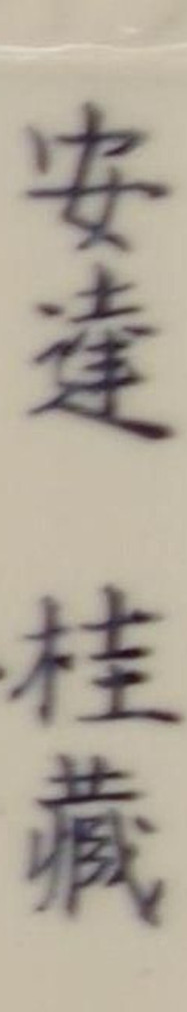安達桂蔵
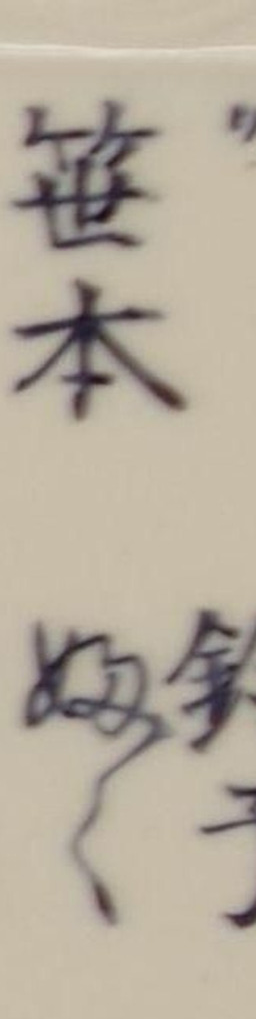笹本ふく
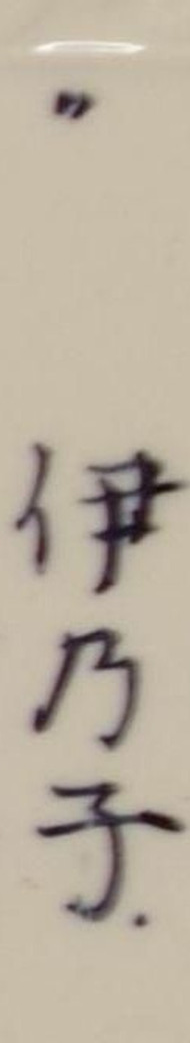伊乃子
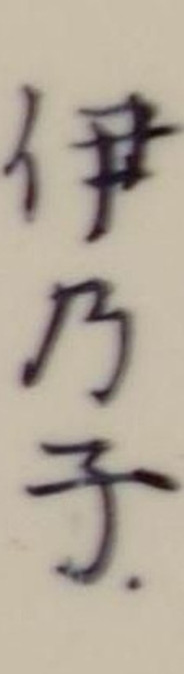伊乃子
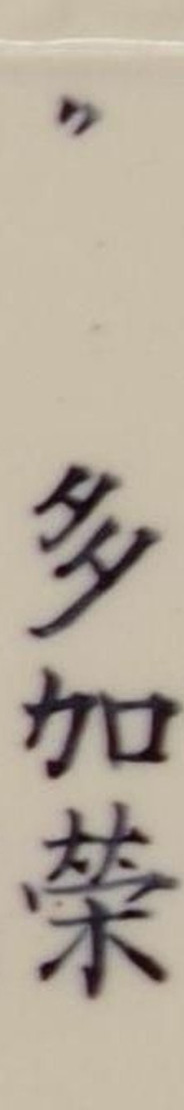多加榮
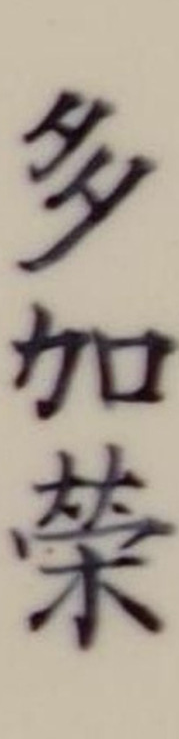多加榮
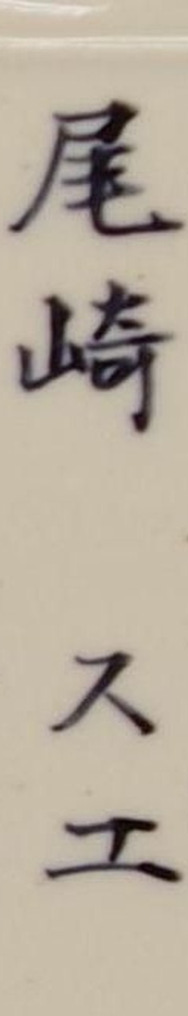尾崎スエ
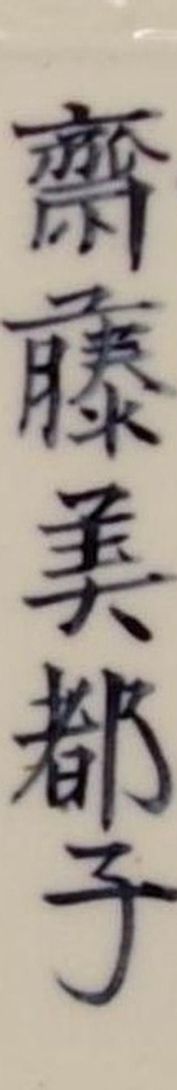斎藤美都子
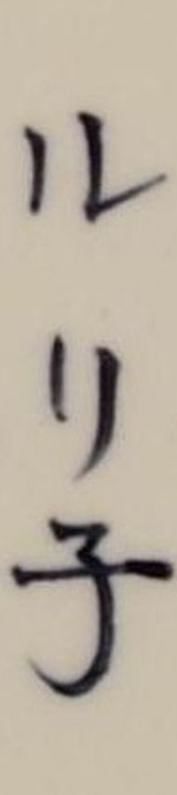ルリ子
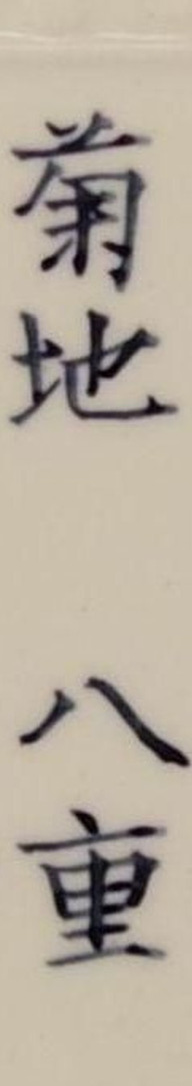菊地八重
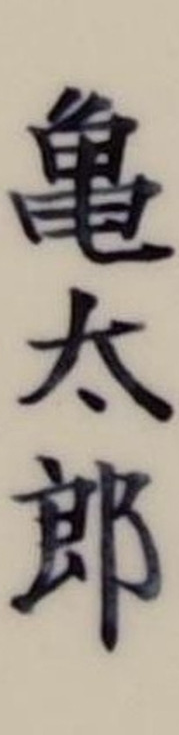亀太郎
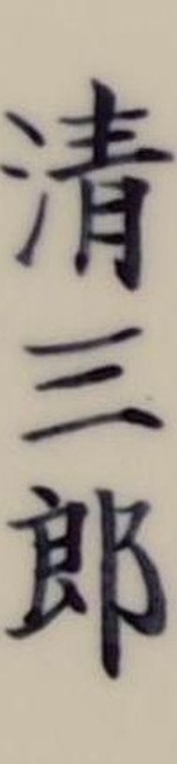清三郎
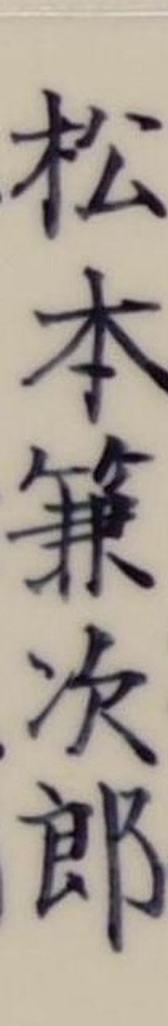松本簾次郎
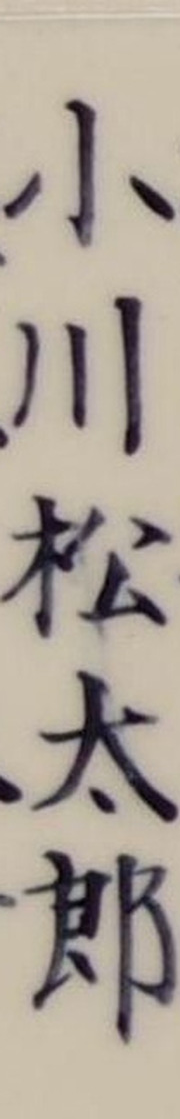小川松太郎
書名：E~L
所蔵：高野山金剛峯寺
